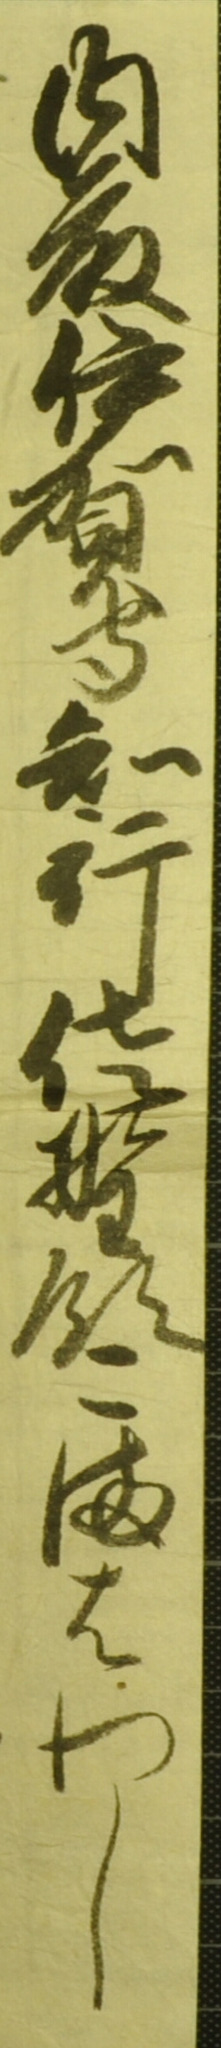内藤伊賀守知行佐野領こまはわし
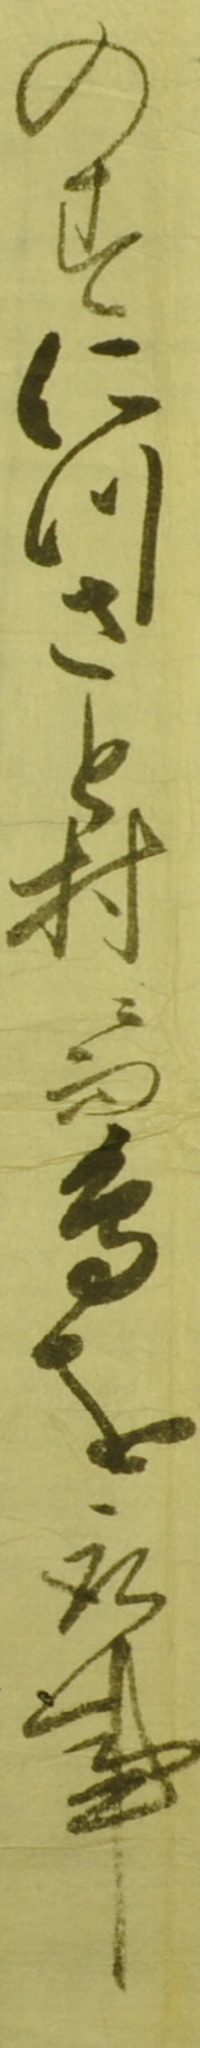のすにつさと村に而鳥を取事
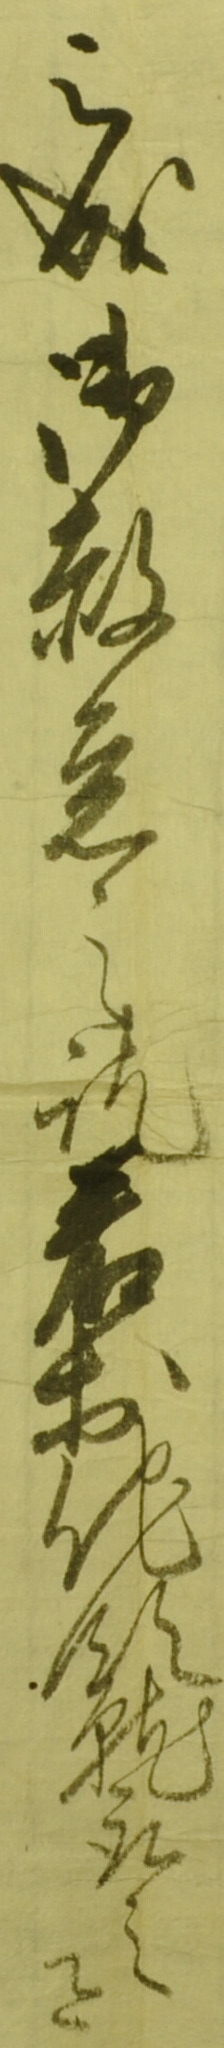被成御赦免之訖若於他領就取之は
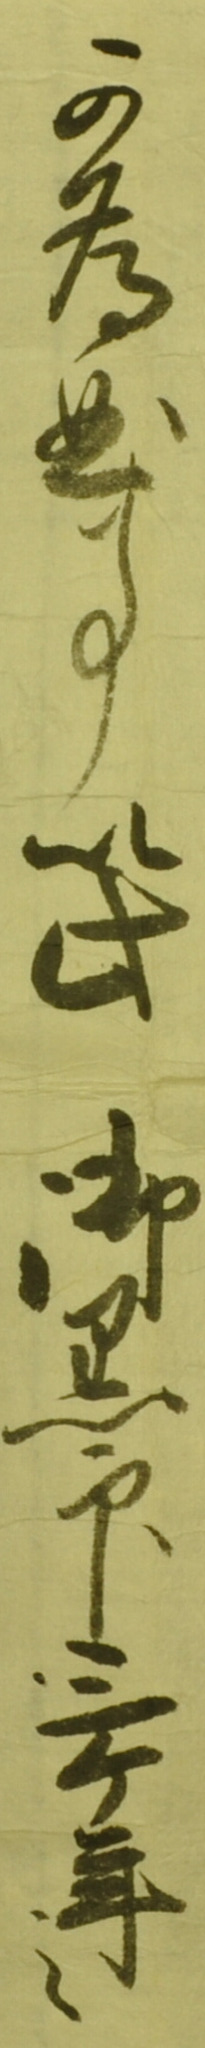可為曲事以此御黒印三ケ年之
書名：獲鳥許可状
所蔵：伊那市立高遠町図書館・合同会社AMANE
